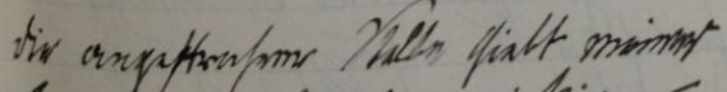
Die angesprochene Stelle hielt meiner
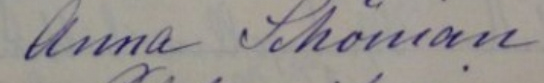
Anna Schönian
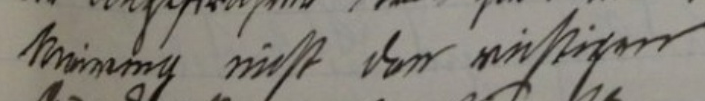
Meinung nicht der einstigen
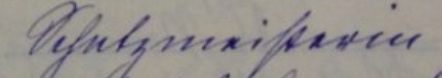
Schatzmeisterin
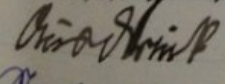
Mitschrift
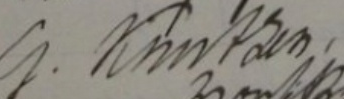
G. Knutzen
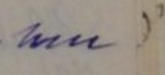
am
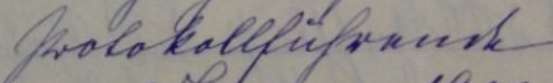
Protokollführend
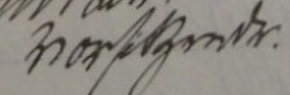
Vorsitzende
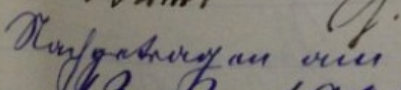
Nachgetragen am
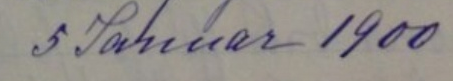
5. Januar 1900
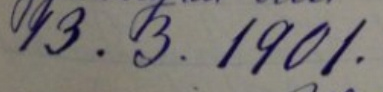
13.3.1901
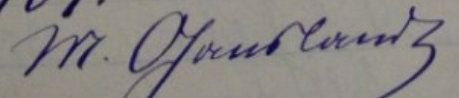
M. Ganzland
